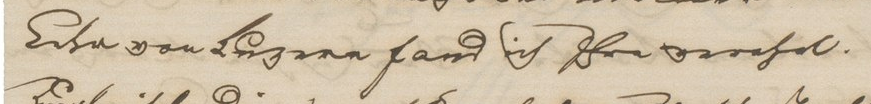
kehr von Luzern fand ich Ihre verehrl.
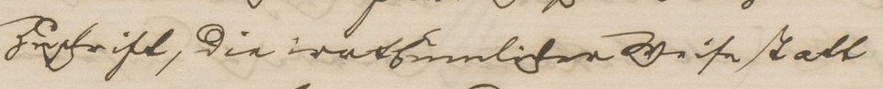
Zuschrift, die irrthümlicher Weise statt
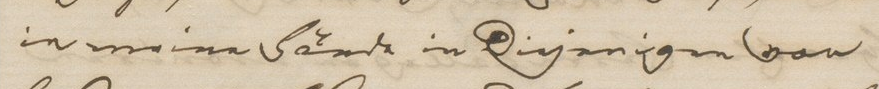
in meine Hände in diejenigen von
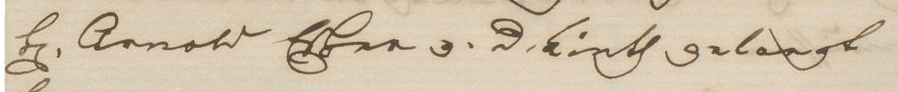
H. Arnold Escher v. d. Linth gelangt
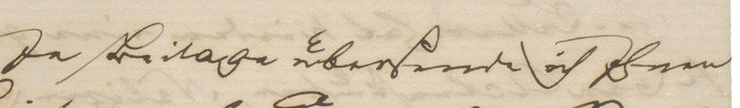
In Beilage übersende ich Ihnen
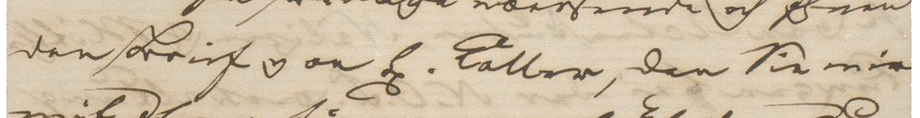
den Brief von H. Koller, den Sie mir
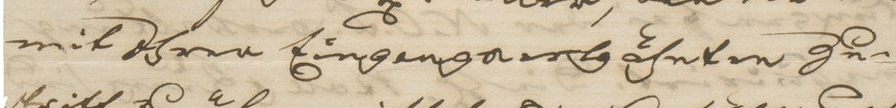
mit Ihrer Eingangs erwähnten Zu-
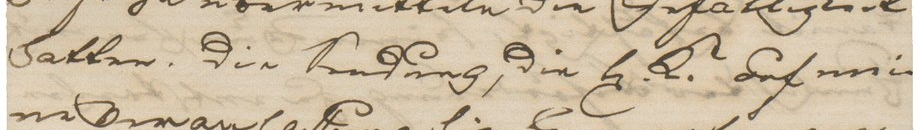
hatten. Die Sendung, die H. K. auf mei-
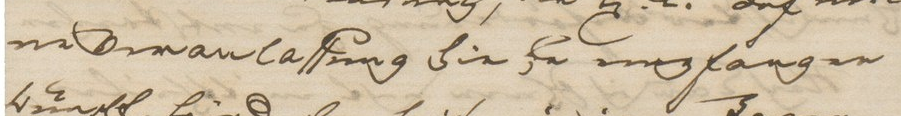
ne Veranlassung hin zu empfangen
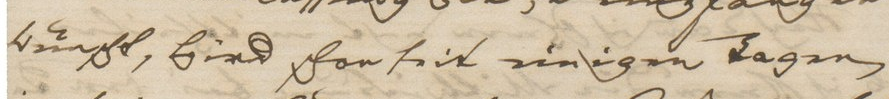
wünscht, wird schon seit einigen Tagen
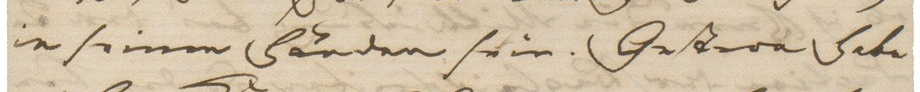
in seinen Händen sein. Gestern habe
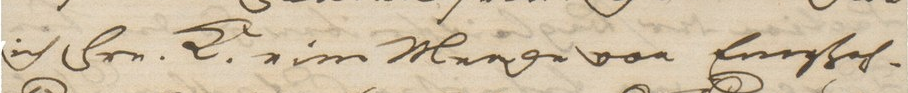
ich Hrn. K. eine Menge von Empfeh-
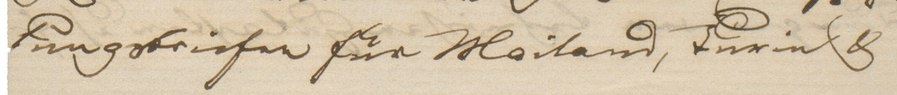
lungsbriefen für Mailand, Turin &
